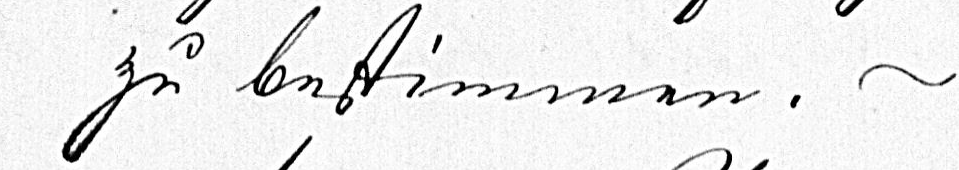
zu bestimmen.
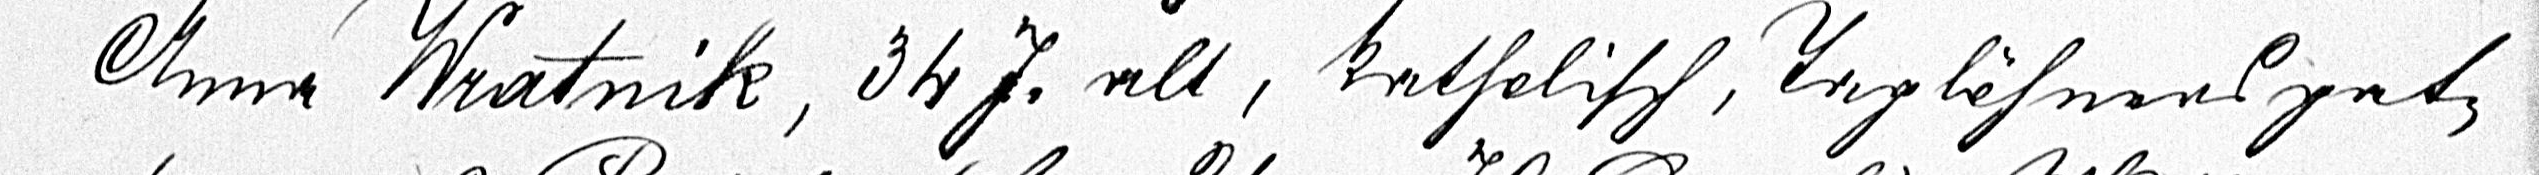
Anna Wratnik, 34 J. alt, katholisch, Taglöhnersgat¬
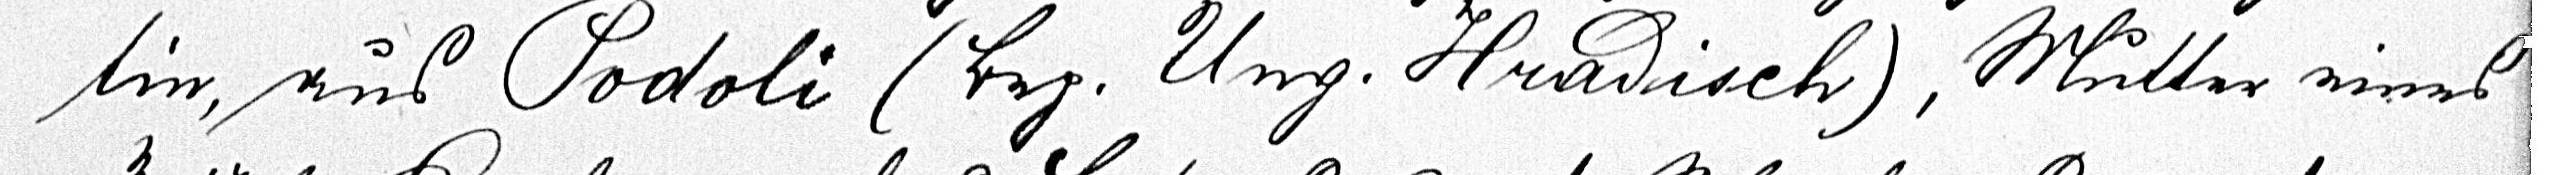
tin, aus Podoli (Beg. Ung. Hradisch), Mutter eines
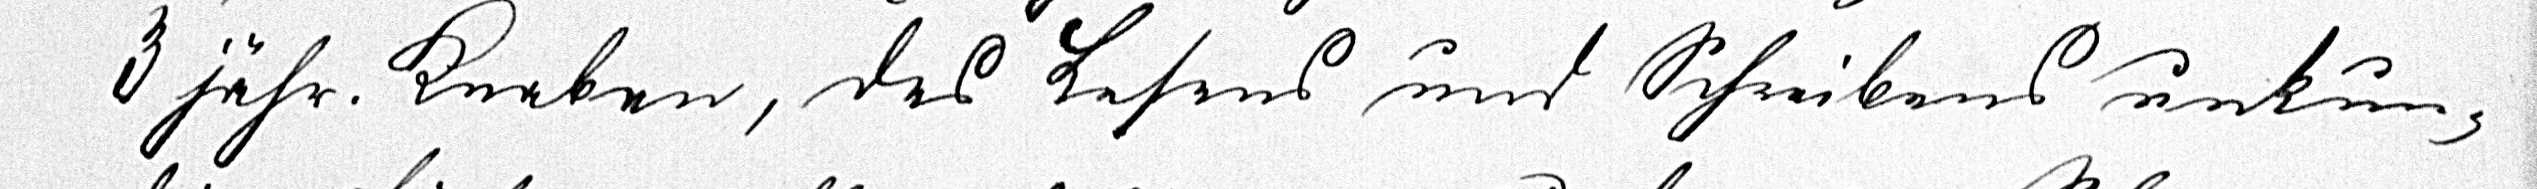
3 jähr. Knaben, des Lehen und Schreibens unkun¬
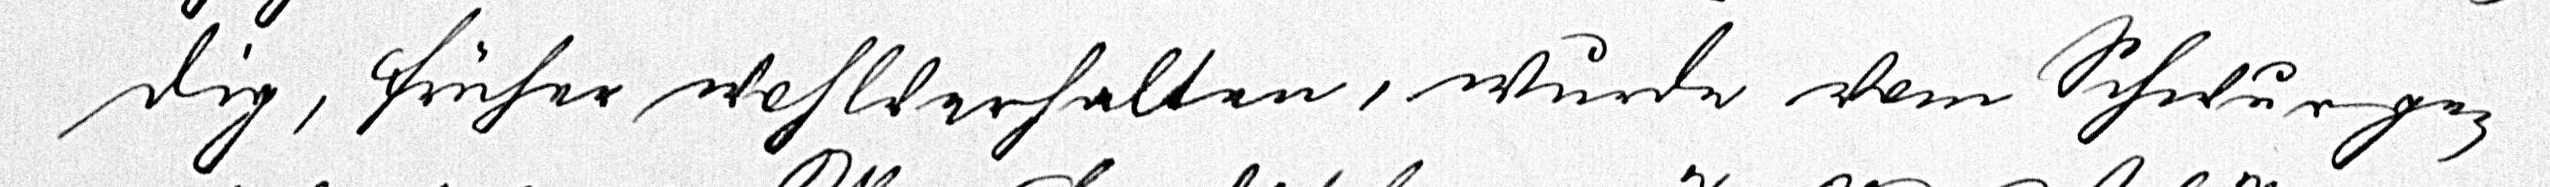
dig, früher wohlverhalten, wurde vom Schwurge¬
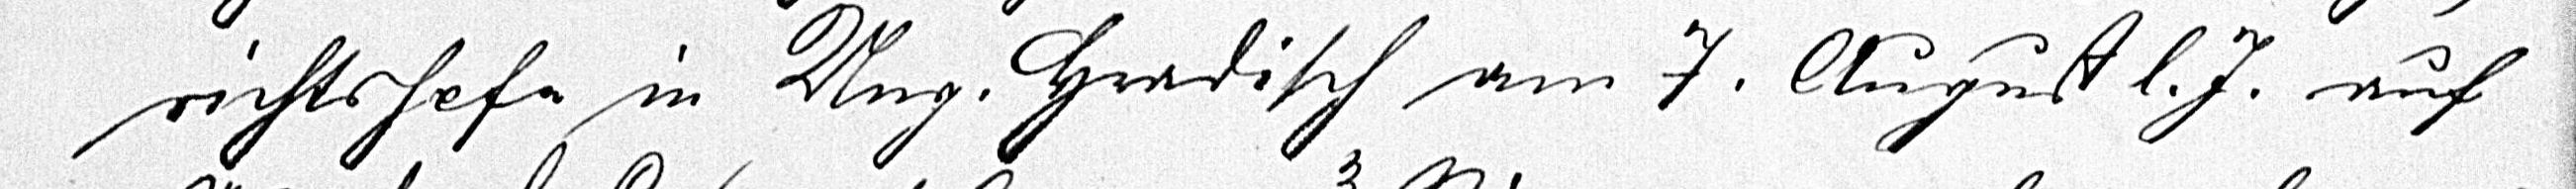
richtshofe in Ung. Gradisch am 7. August l. J.. auf
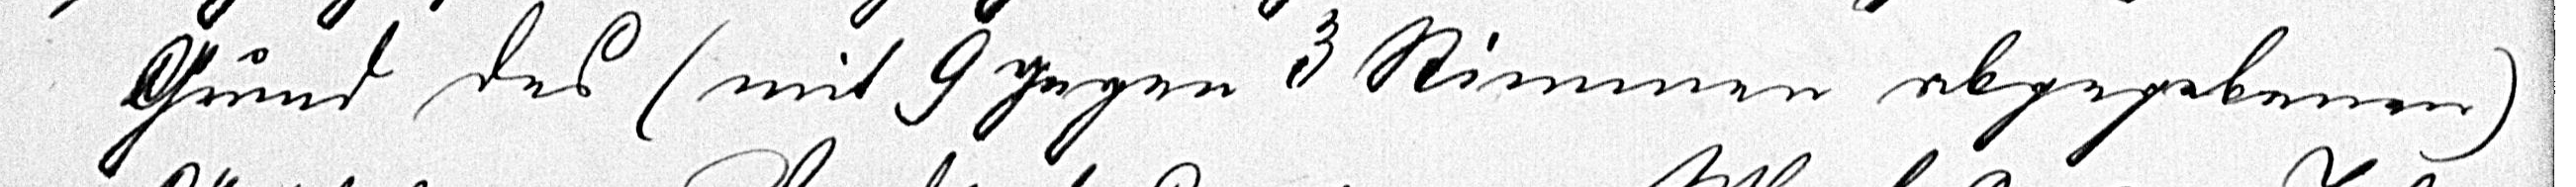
Grund des (mit 9 gegen 3 Stimmen abgegebenen)
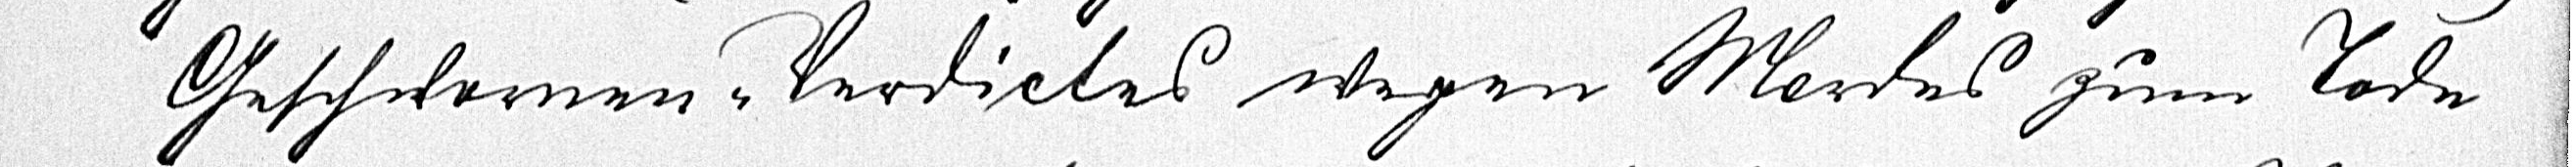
Geschwornen-Verdictes wegen Mordes zum Tode
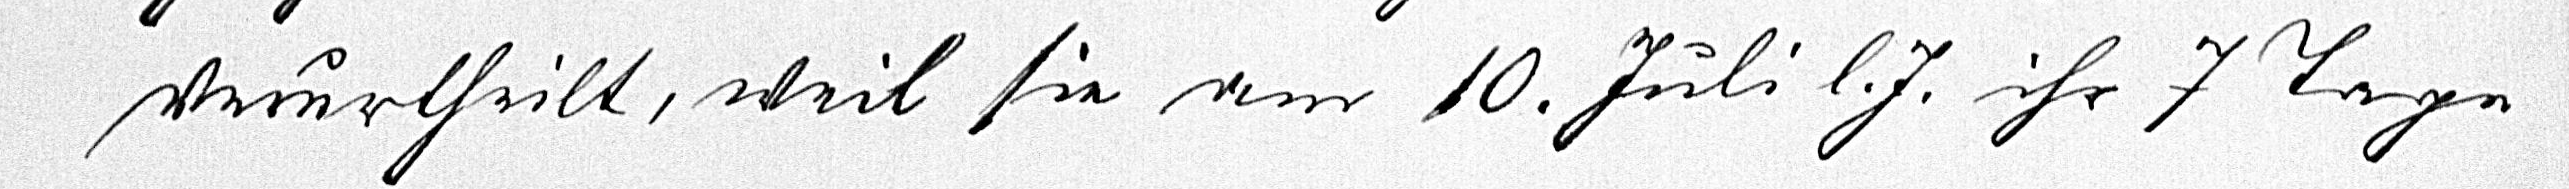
verurtheilt, weil sie am 10. Juli l. J. ihr 7 Tage
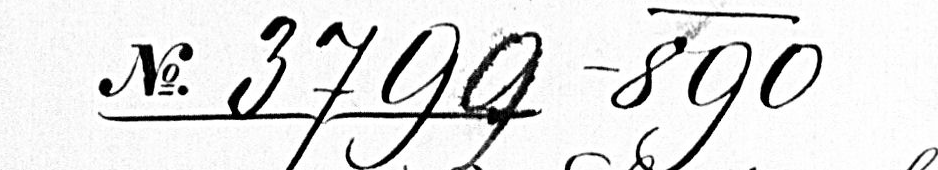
N° 3799-890
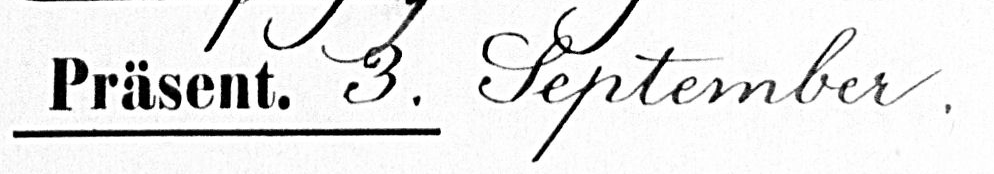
Präsent. 3. September.
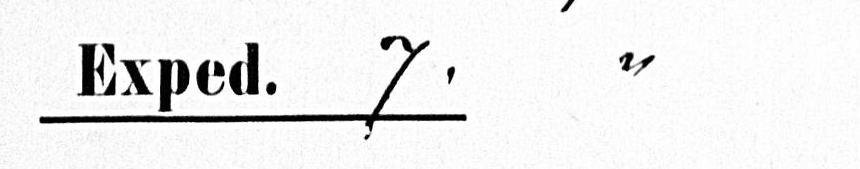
Exped. 7. September.
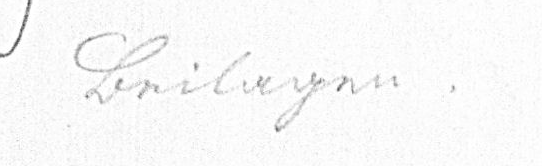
Beilagen.
